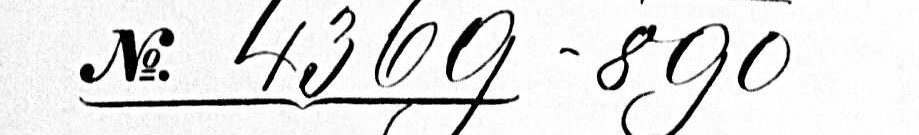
No. 4369 - 890
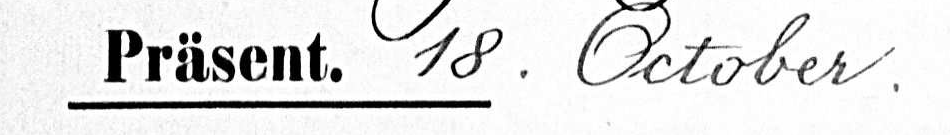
Präsent. 18. October.
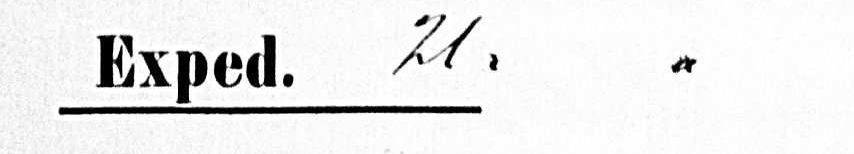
Exped. 21. October.
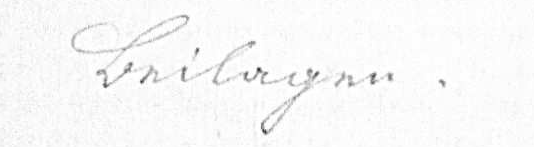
Beilagen.
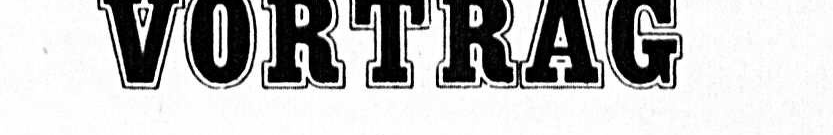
Vortrag
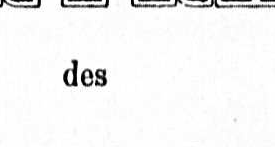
des
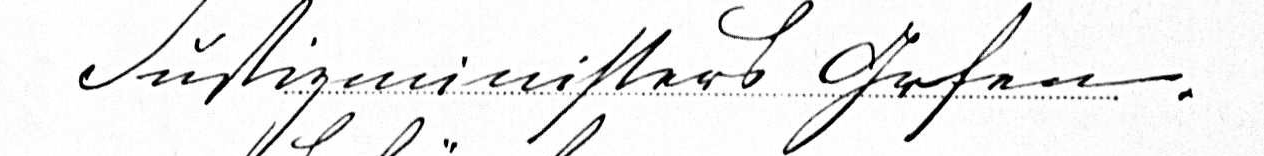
Justizministers Grfen.
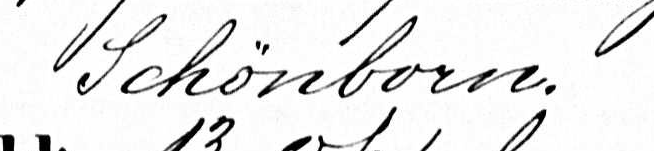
Schönborn.
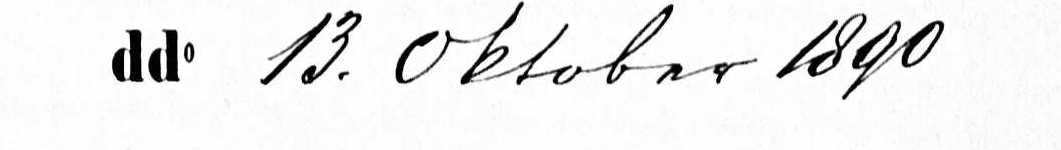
ddo 13. Oktober 1890
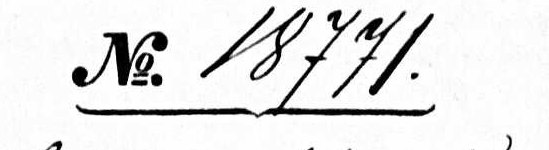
No. 18771.
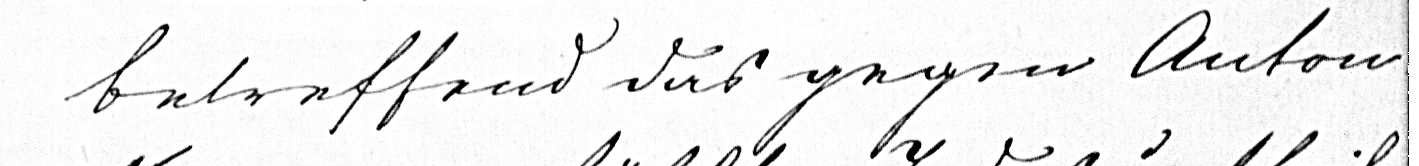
betreffend das gegen Anton
